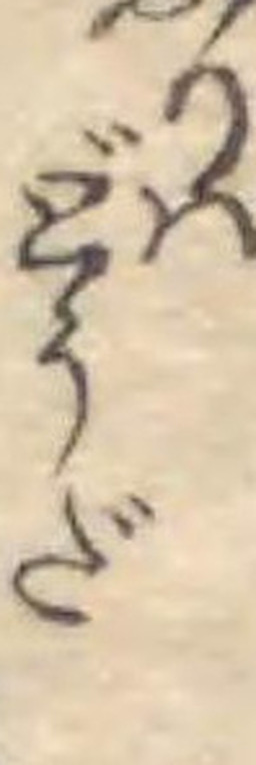どうだ
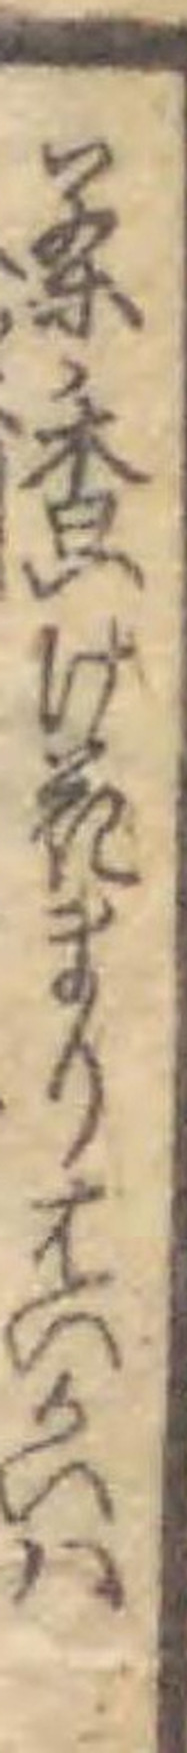茶香いけ花まりはいかいは
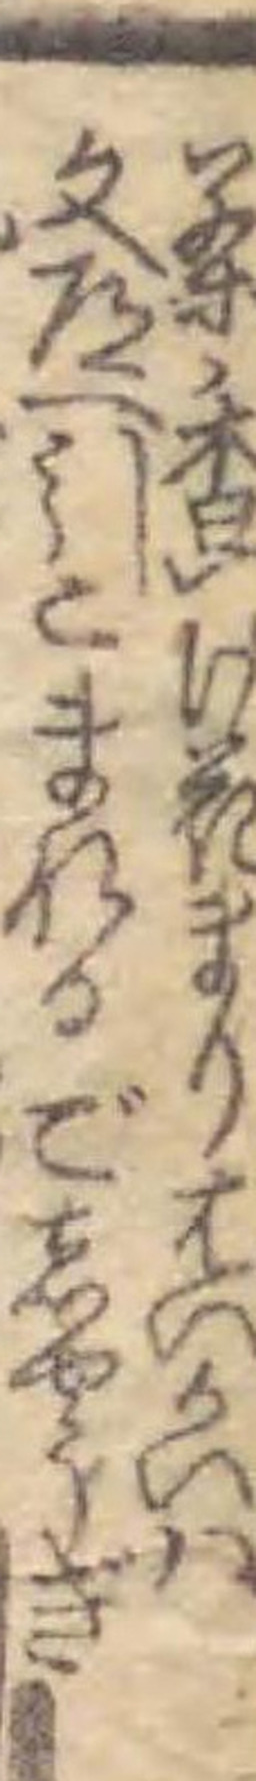文道へ引こまれるごしやうぎ
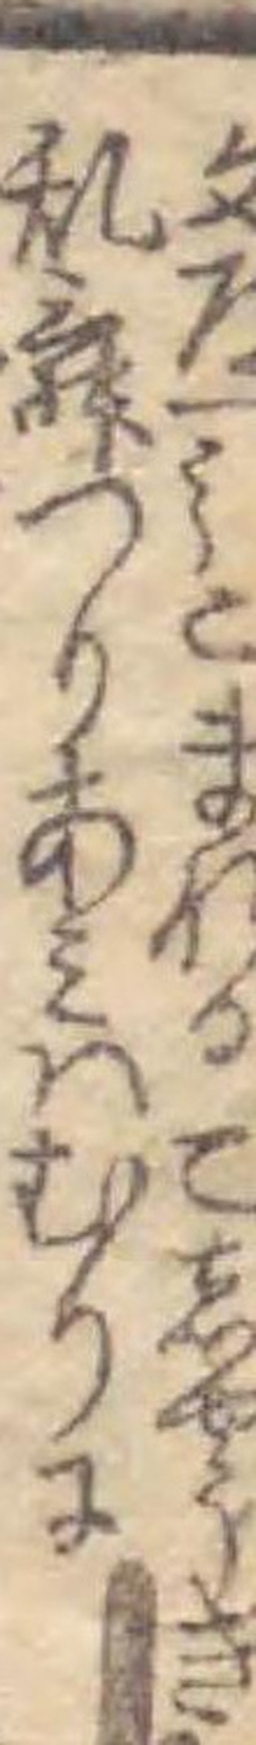乱舞つりあみはむりに
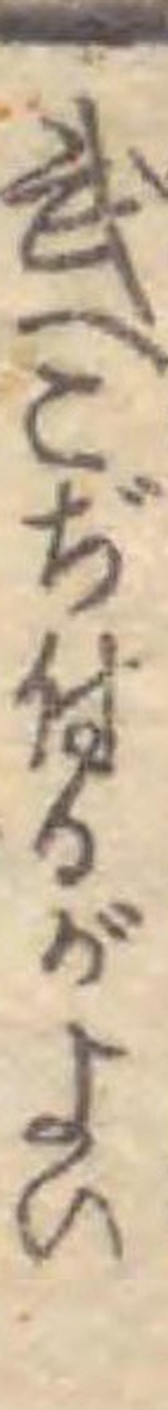武へこぢ付るがよい
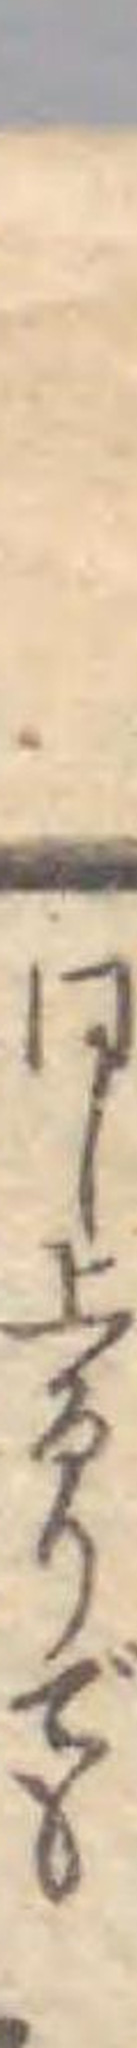同し上るりでも
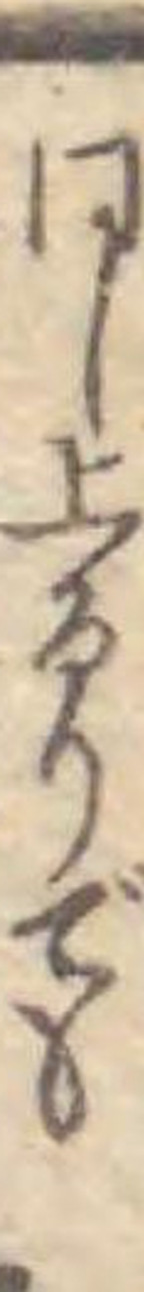同し上るりでも
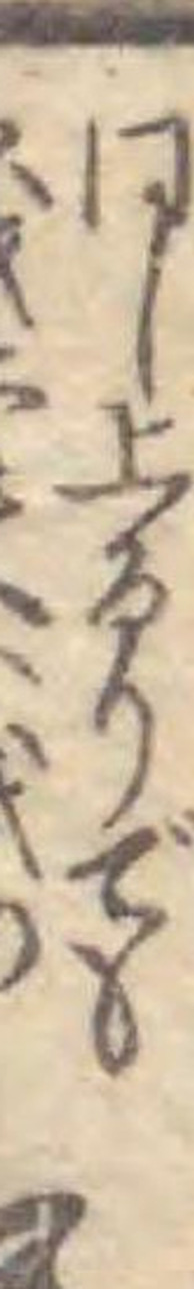同し上るりでも
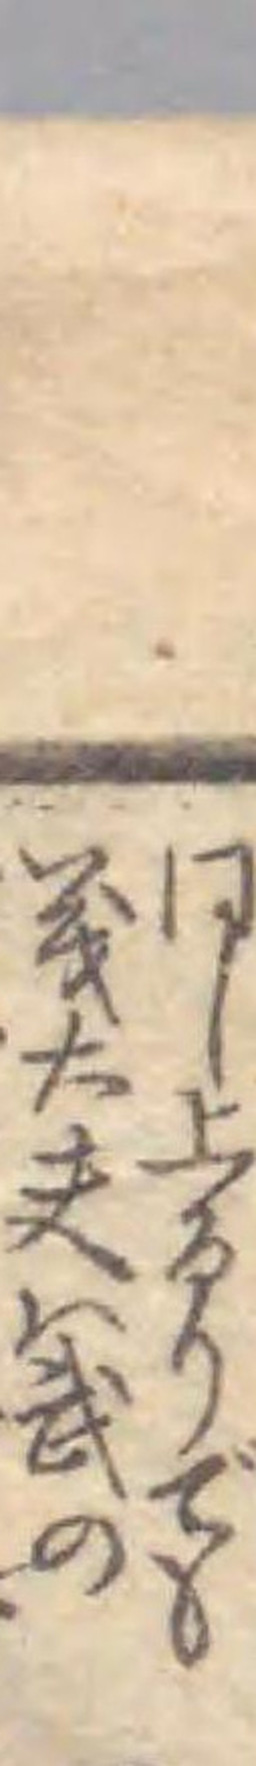義太夫は武の
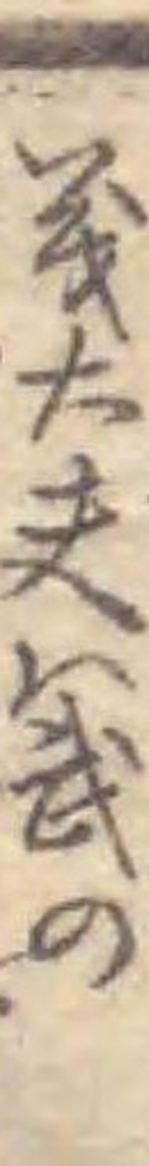義太夫は武の
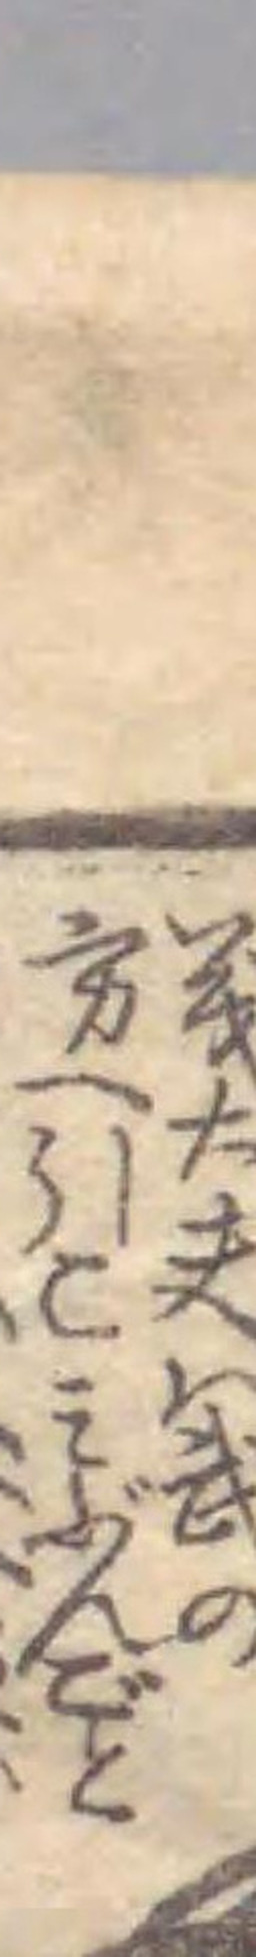方へ引こみぶんごと
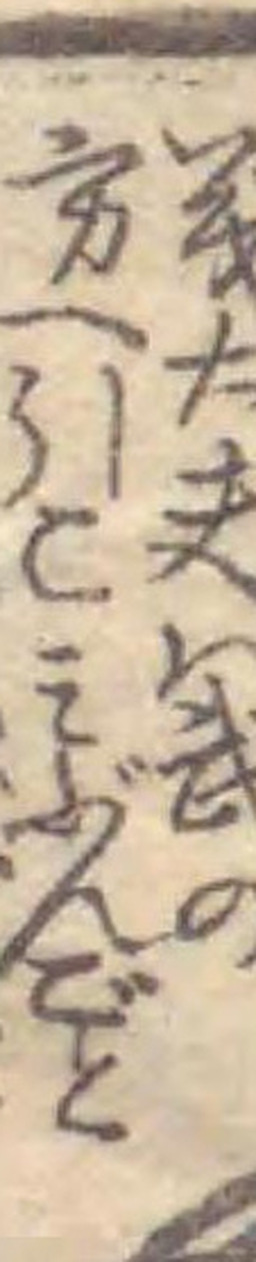方へ引こみぶんごと
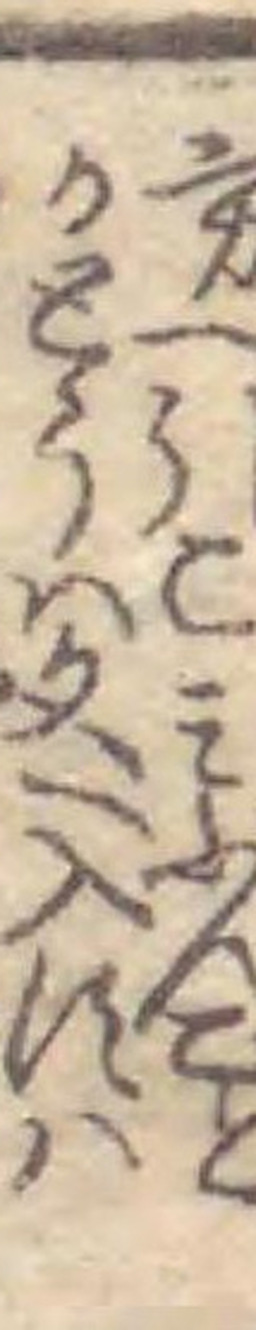かとうは文へ入すは
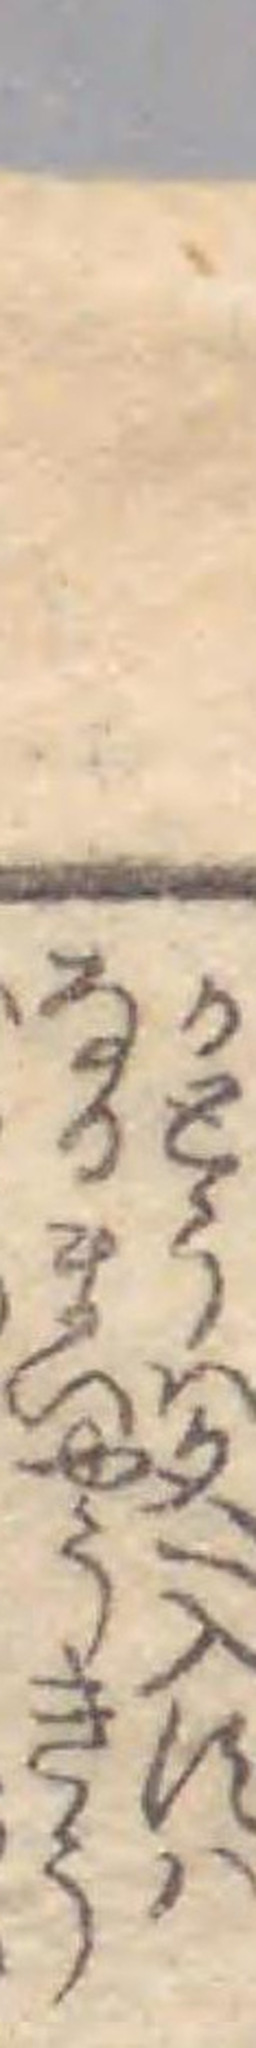なるまいやうきう
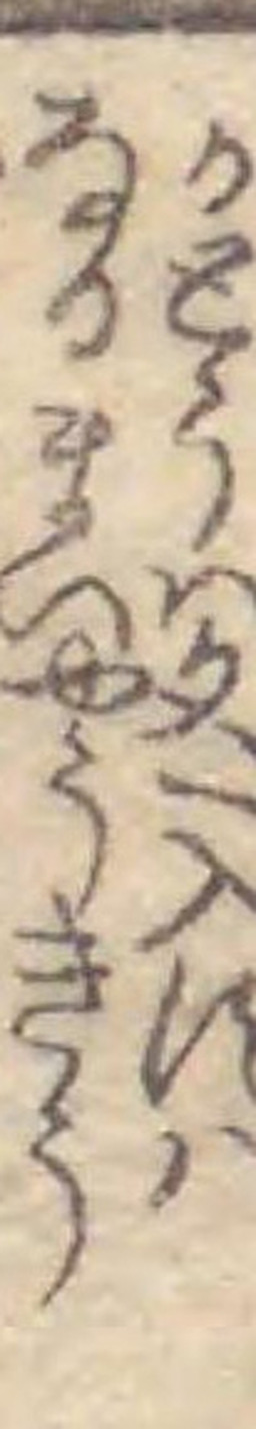なるまいやうきう
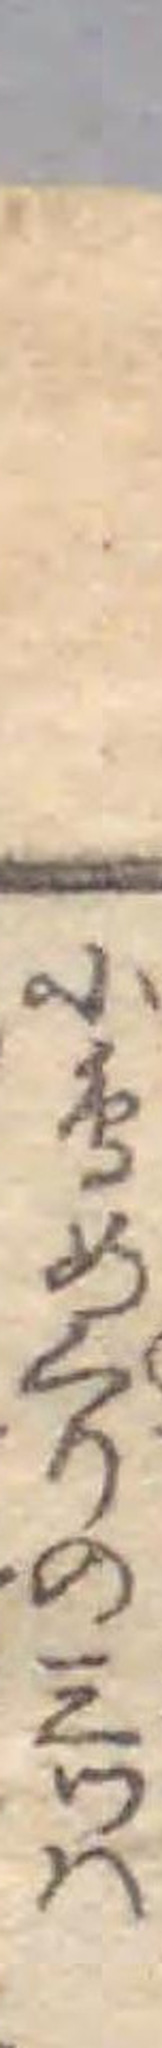小鳥めくりの三つは
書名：文武二道万石通 : 3巻
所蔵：国立国会図書館 National Diet Library, JAPAN
